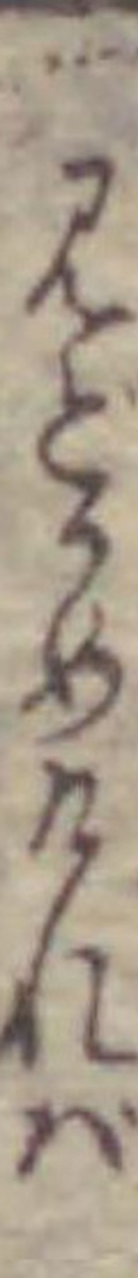見どかめければ
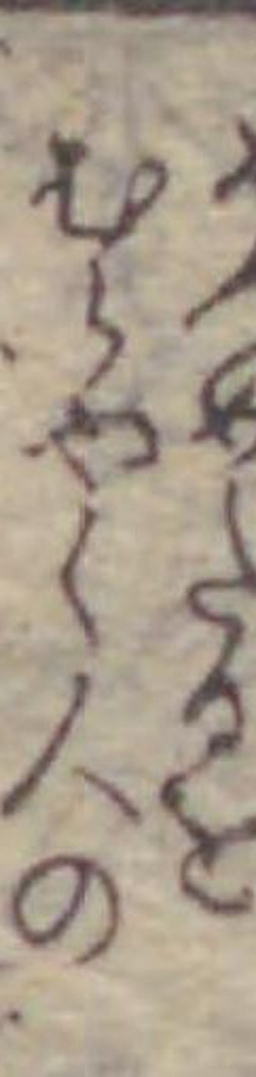むらやく人の
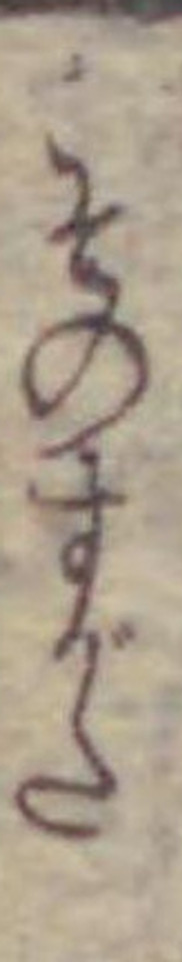そのすがた
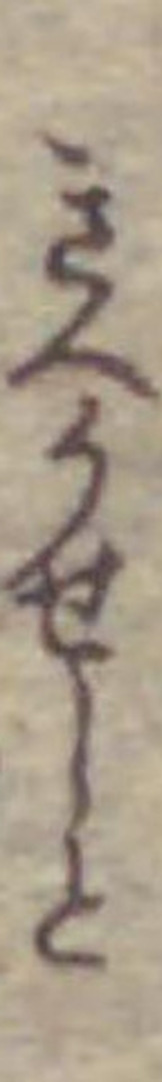きへうせしと
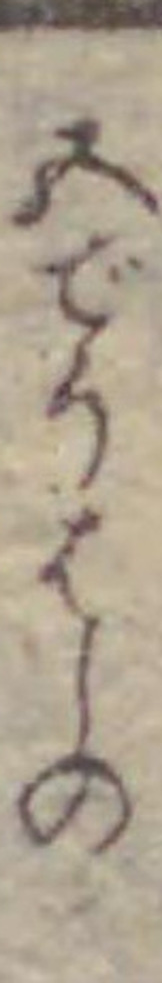五でうはしの
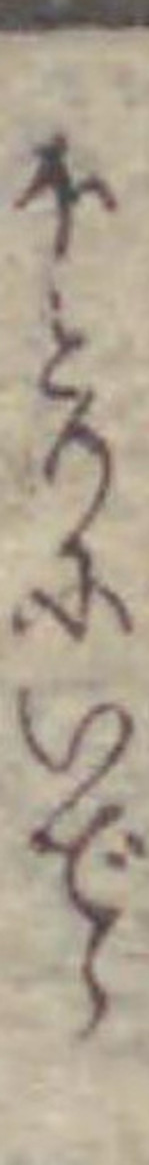ほとりにいでゝ
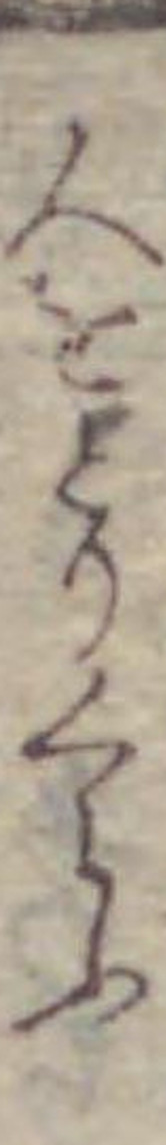人をとりくらふ
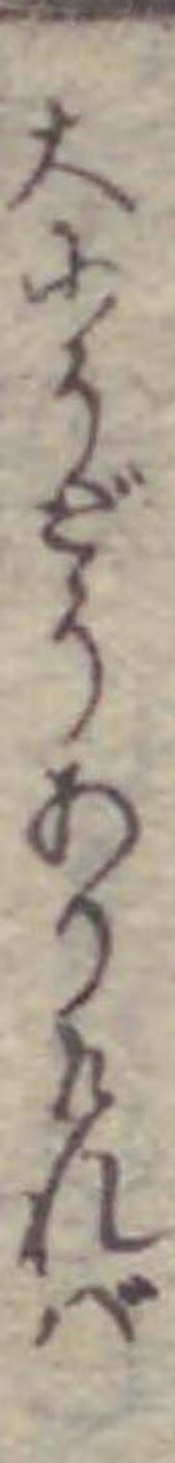大にうどうありければ
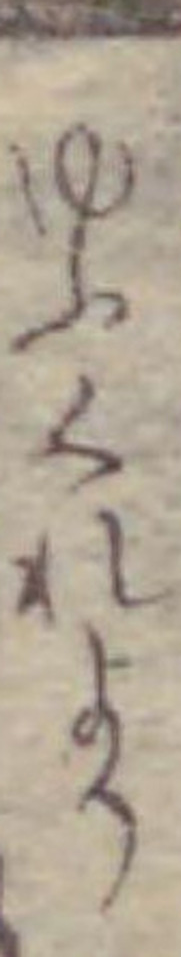ゆふくれより
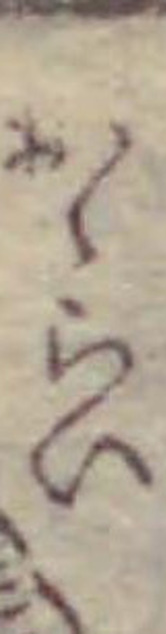おゝらい
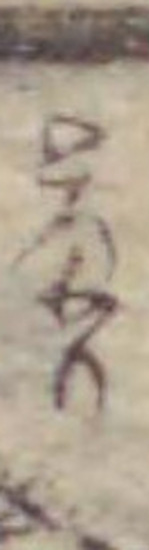とまり
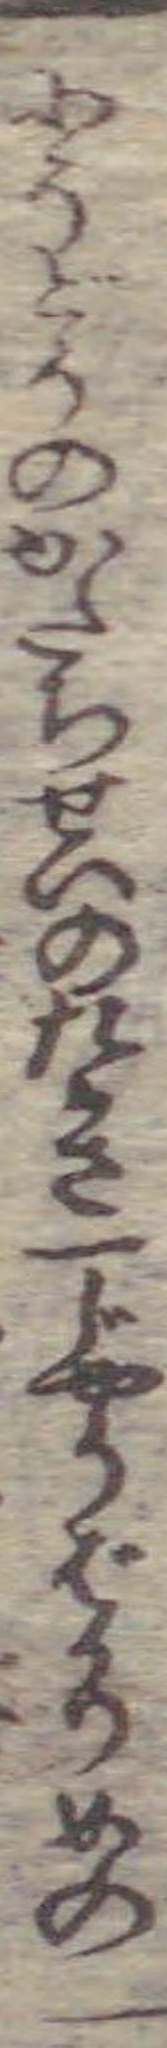にうどうのかたちせいのたかさ一じやうばかりめの
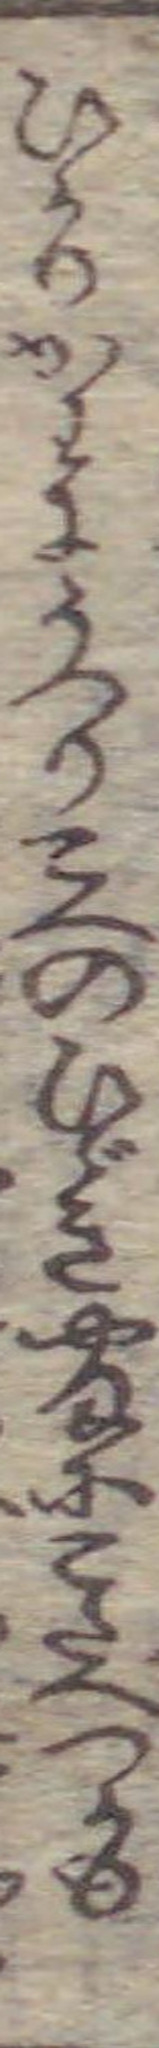ひかりかわにうつりてこへのひゞきやまにこたへつかも
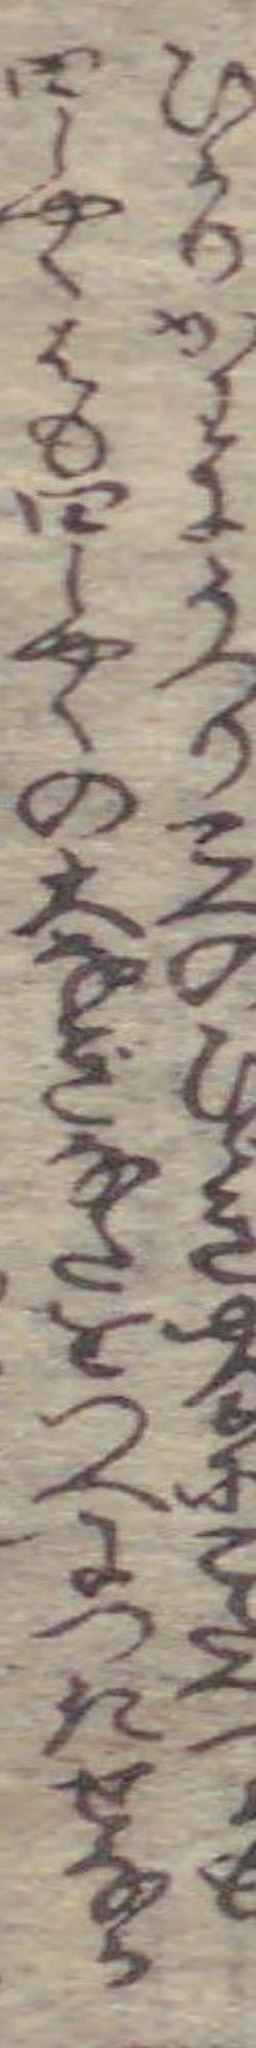四しやくはも四しやく大なぎなたをつへにつきせなか
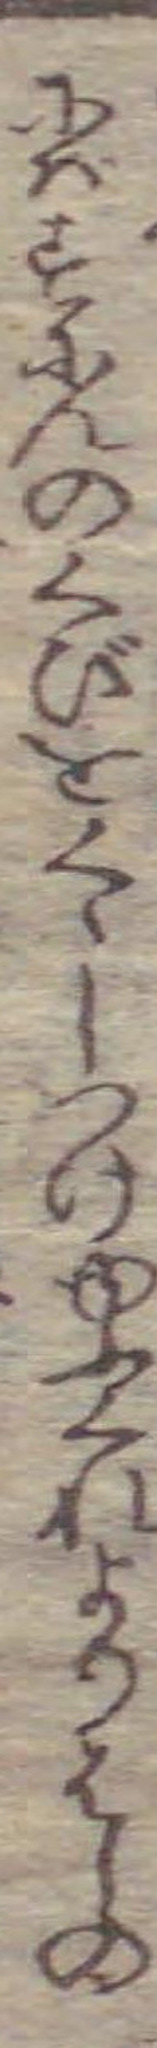にはすにんのくびをくゝしつけゆふくれよりはしの
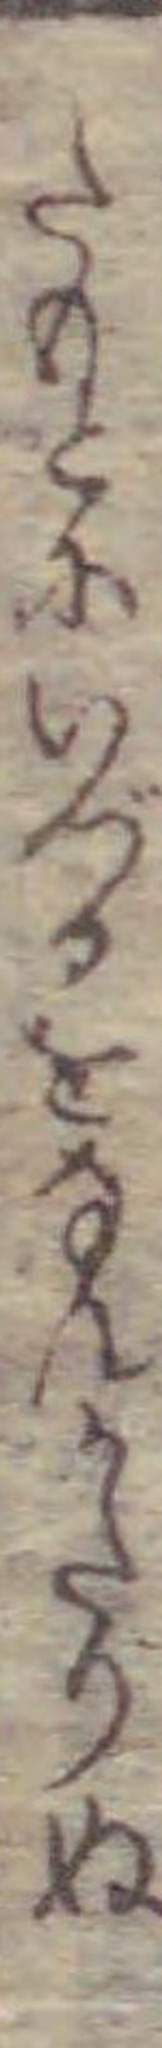たもとにいづるをなんかたりぬ
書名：武家物奇談 : 3巻
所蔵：国立国会図書館 National Diet Library, JAPAN
